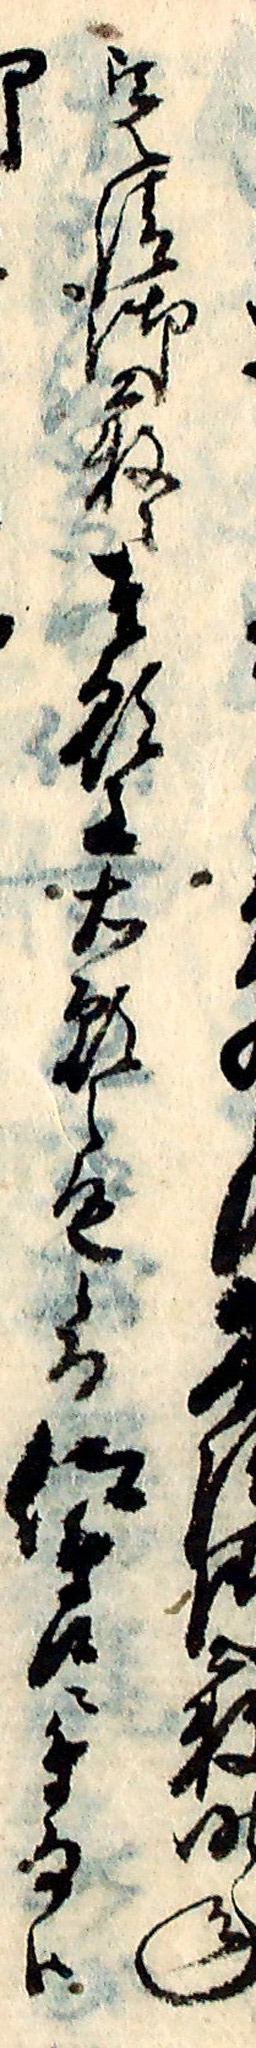定請御藪に奉願上右願之通被為仰付候に付ては
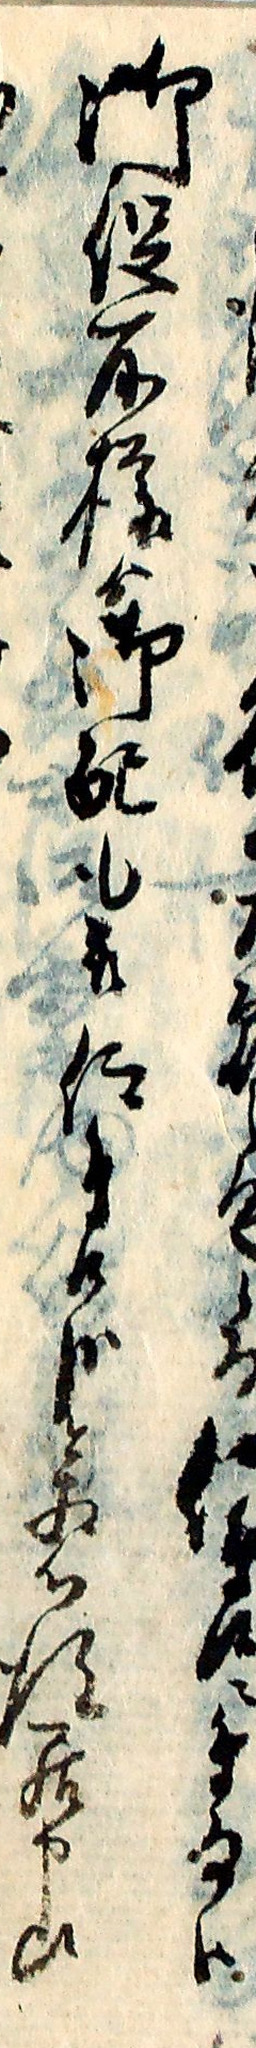御役所様ゟ御配も被仰付候哉と相心得居申候
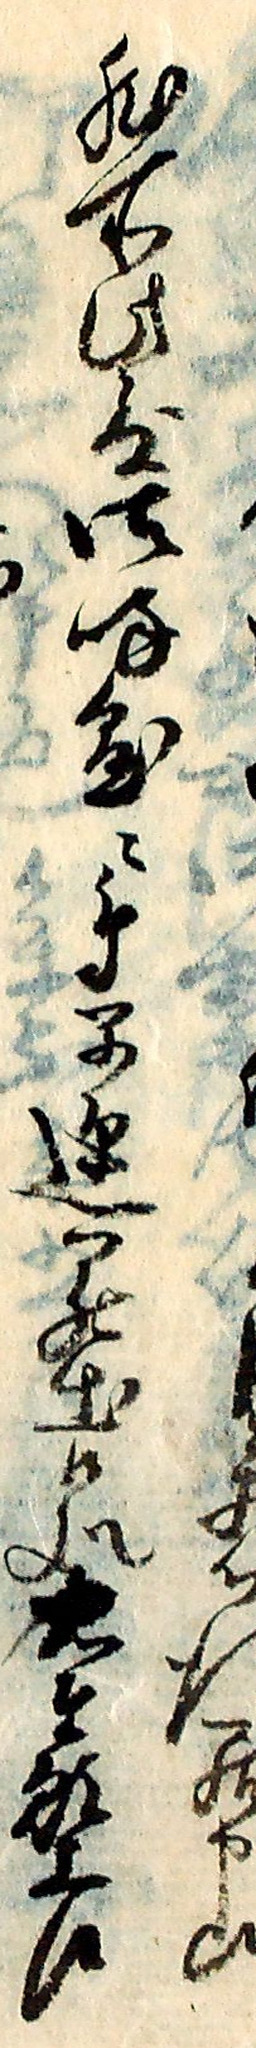然所此度御呼懸に付早速罷出候処右奉願上候
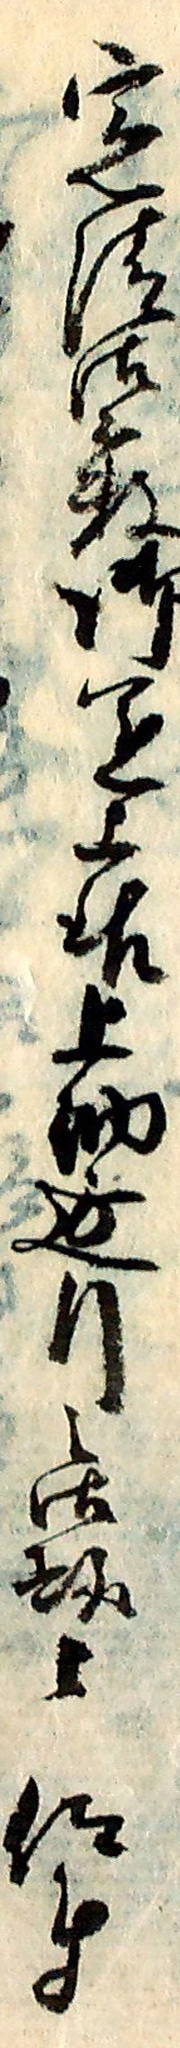定請御藪御運上銀上納延引之御趣被仰付
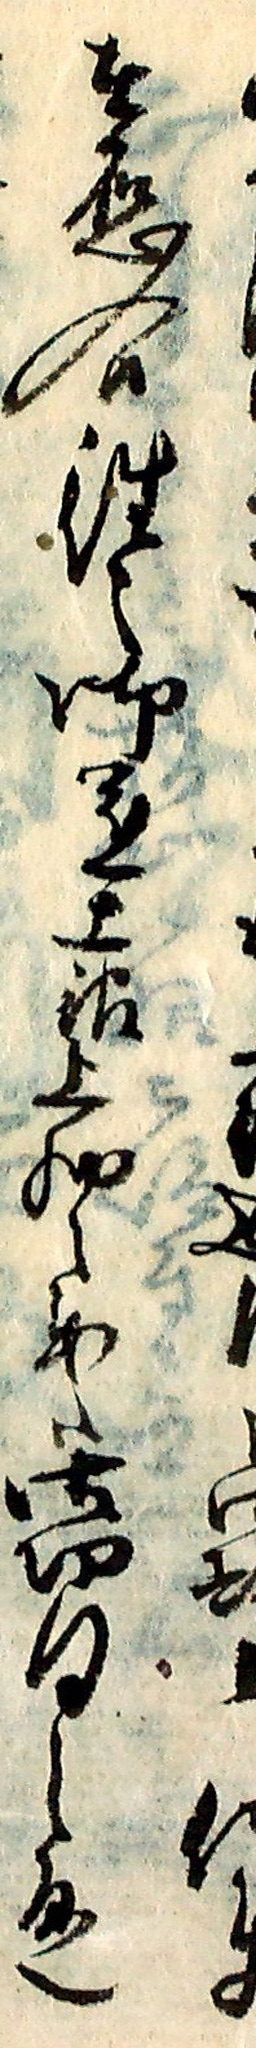奉恐入候往々御運上銀上納之義は御切月之通
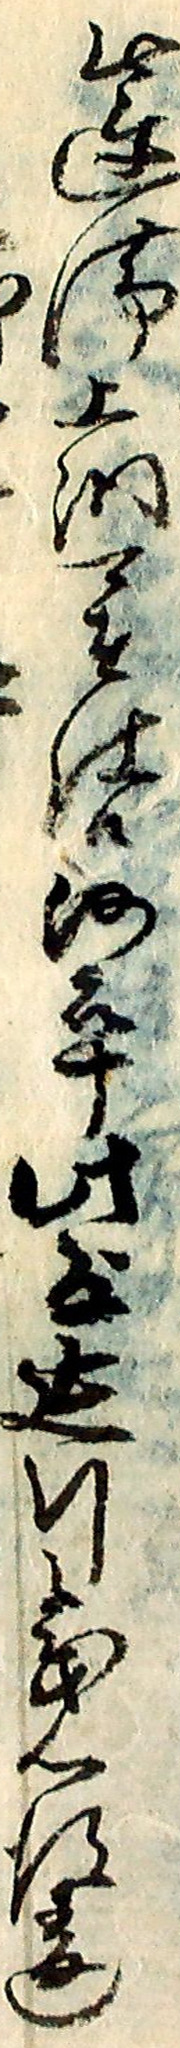無遅滞上納可奉仕候何卒此度延引之義心得違
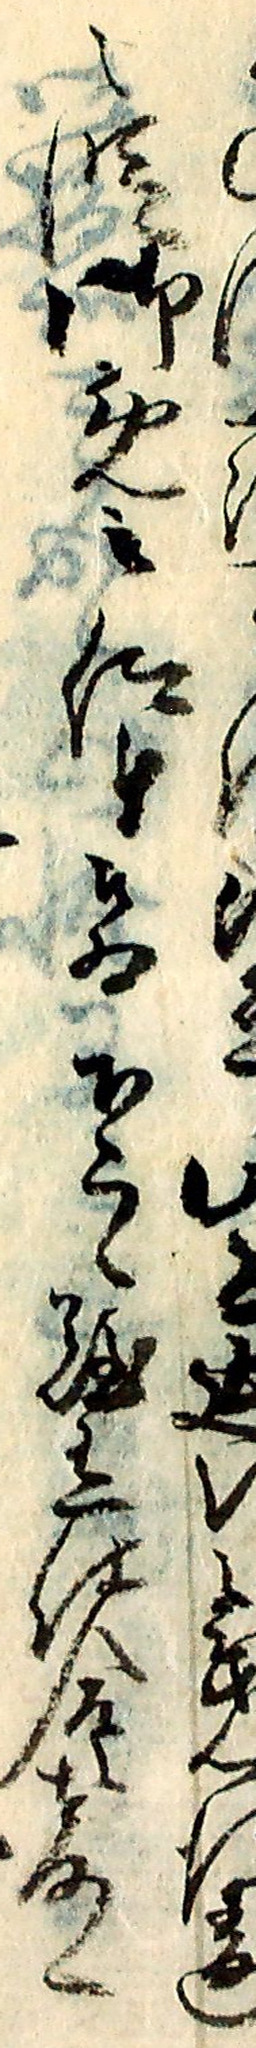之段御免被仰付被為下候はゝ難有仕合に奉存候
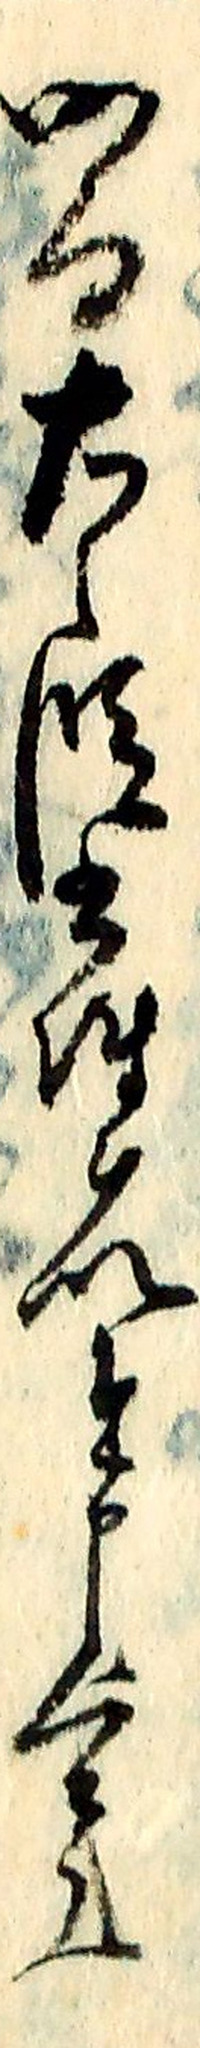仍て右之段書附を以奉申上候以上
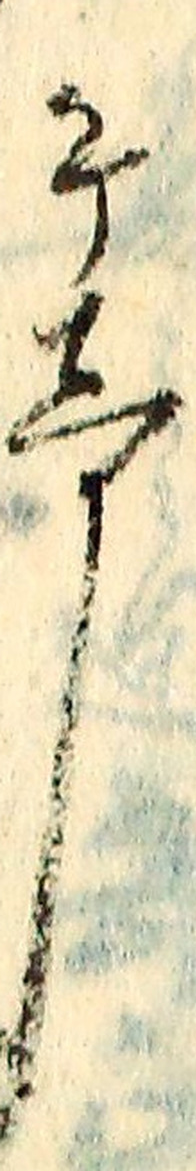午十二月
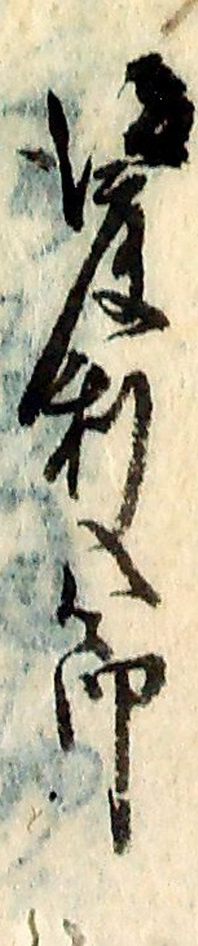後藤利八郎
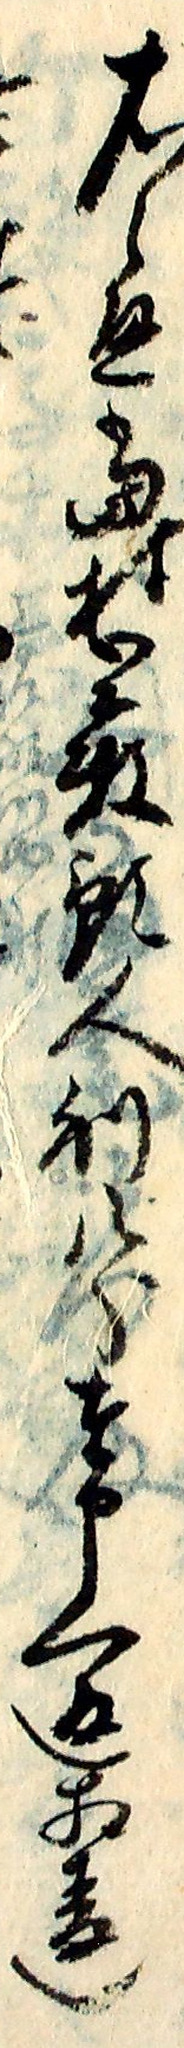右之通当村御藪願人利八郎奉申上通相違
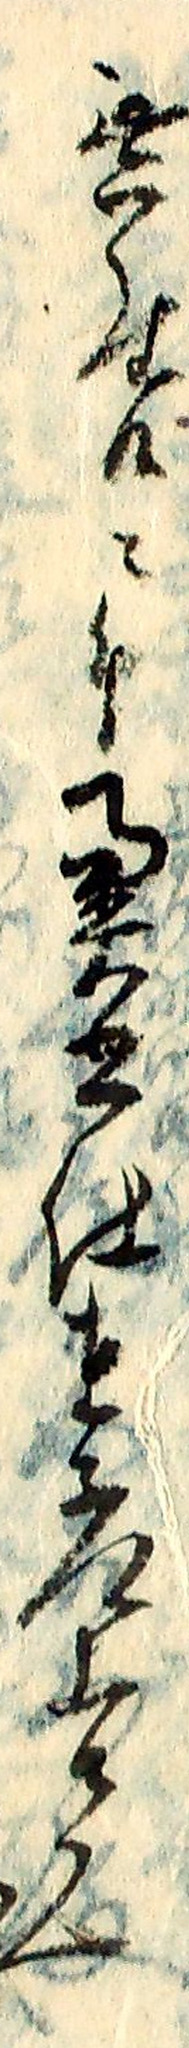無御座候に付奥書仕奉差上候以上
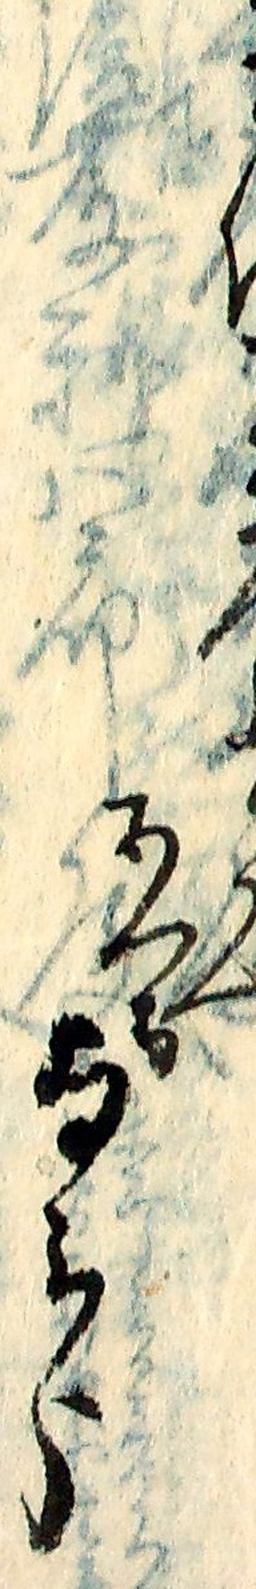与三郎
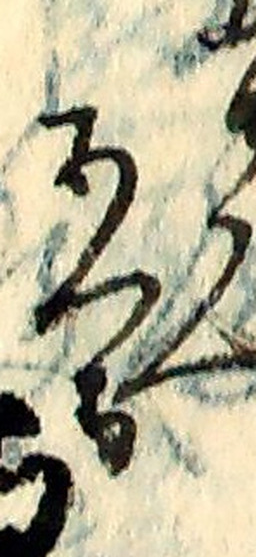五人与
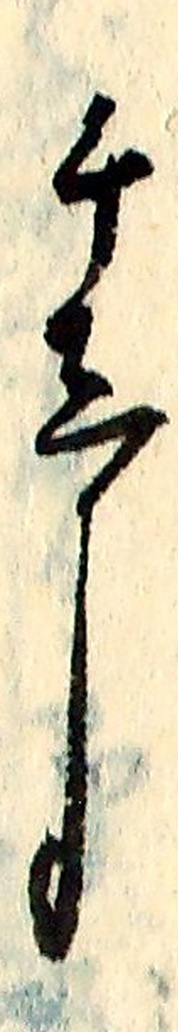午十二月
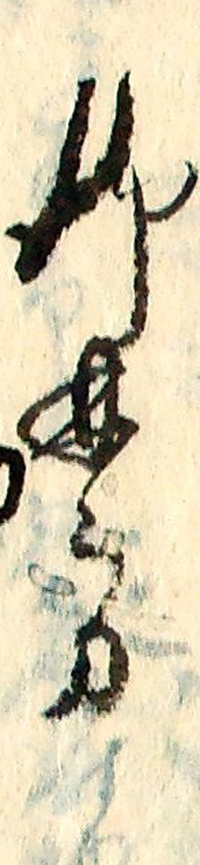御林方
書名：諸御願書控(後藤氏壱番）
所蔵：鳴門教育大学 Naruto University of Education
